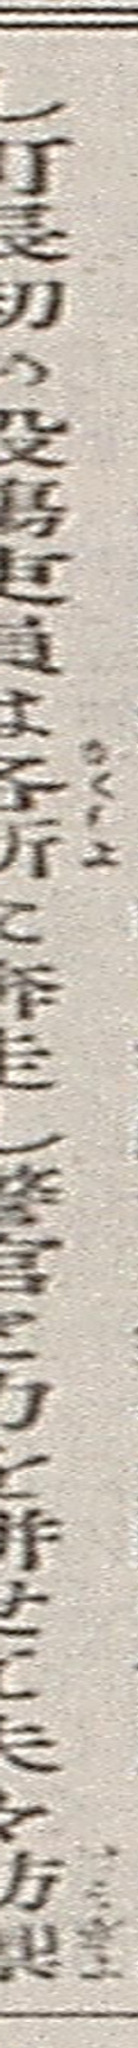し町長初め役場吏員は各所に奔走し警官と力を併せて夫々防禦
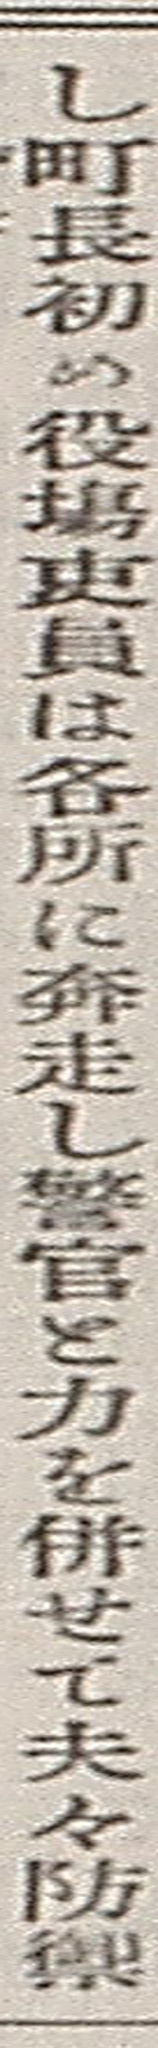し町長初め役場吏員は各所に奔走し警官と力を併せて夫々防禦
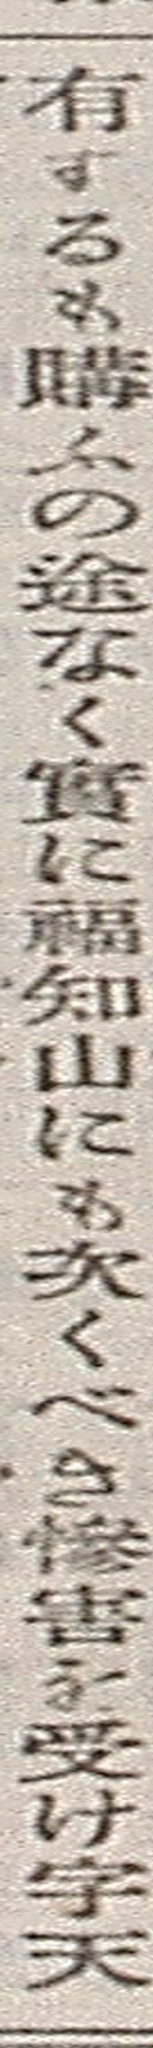有するも贖ふの途なく実に福知山にも次くべき惨害を受け字天
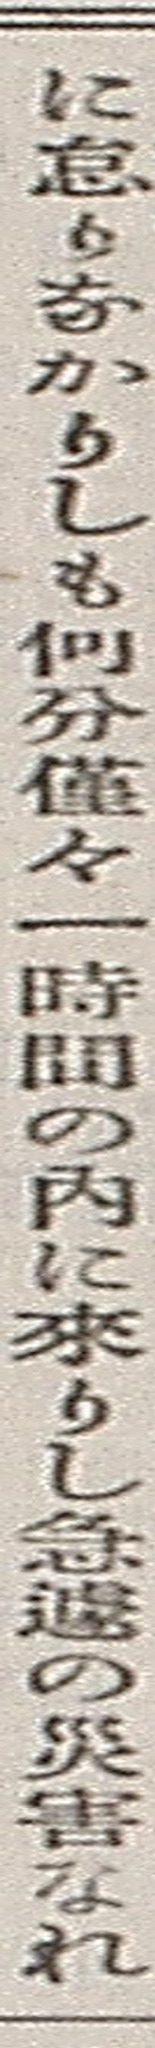に怠りなかりしも何分僅々一時間の内に来りし急遽の災害なれ
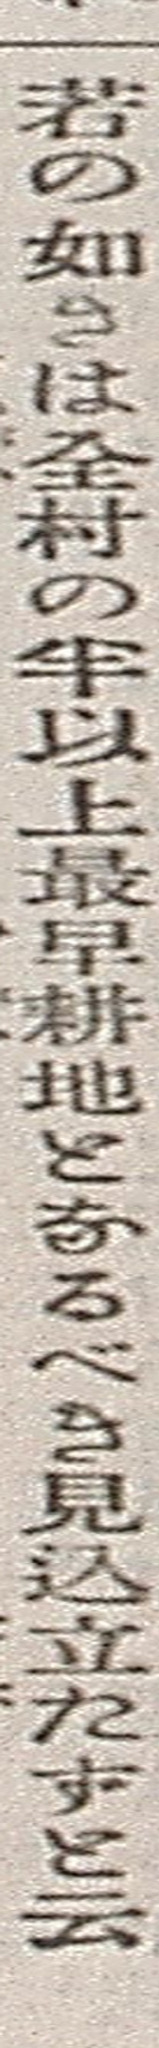若の如きは全村の半以上最早耕地となるべき見込立たずと云
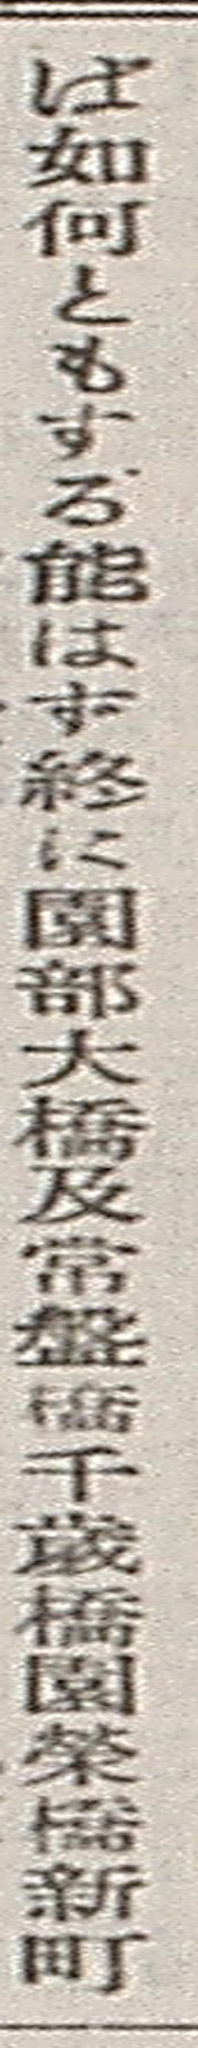ば如何ともする能はず終に園部大橋及常盤橋千歳橋園栄橋新町
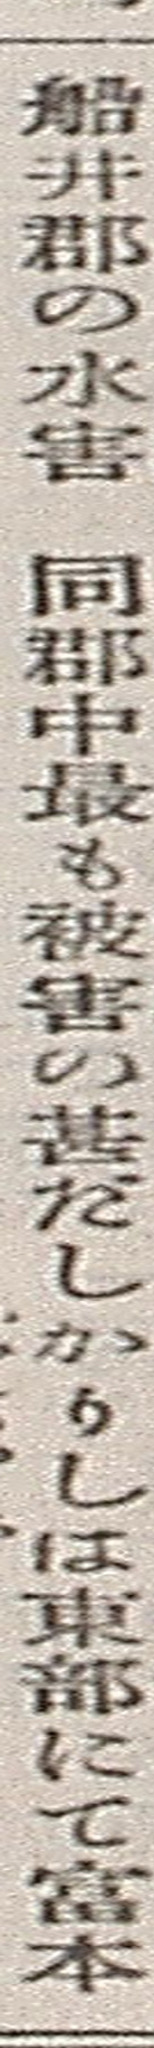船井郡の水害同郡中最も被害の甚だしかりしは東部にて富本
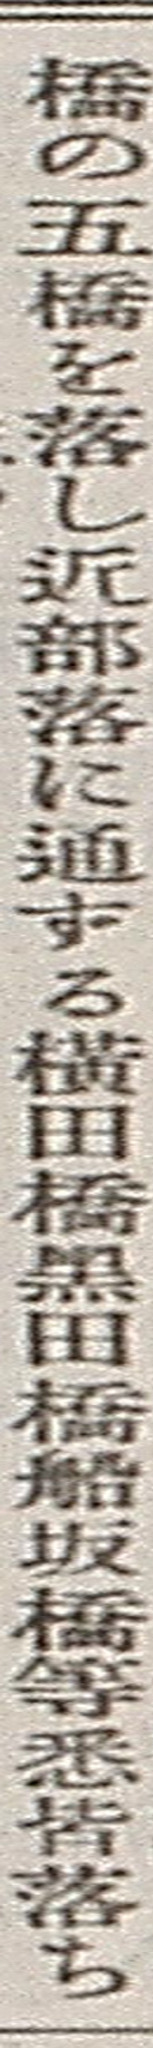橋の五橋を落し近部落に通ずる横田橋黒田橋船板橋等悉皆落ち
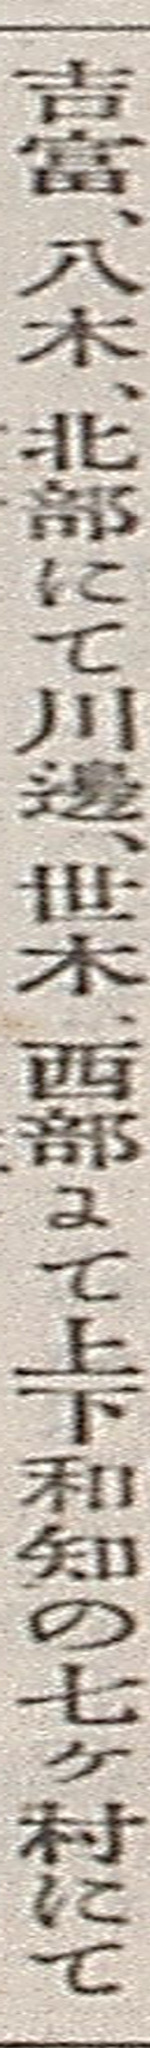吉富、八木、北部にて川辺、世木、西部にて上下和知の七ヶ村にて
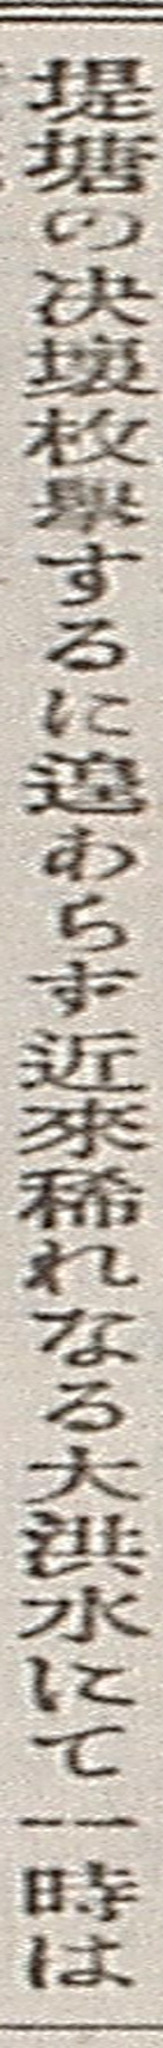堤塘の决壊枚挙するに遑あらず近来稀れなる大洪水にて一時は
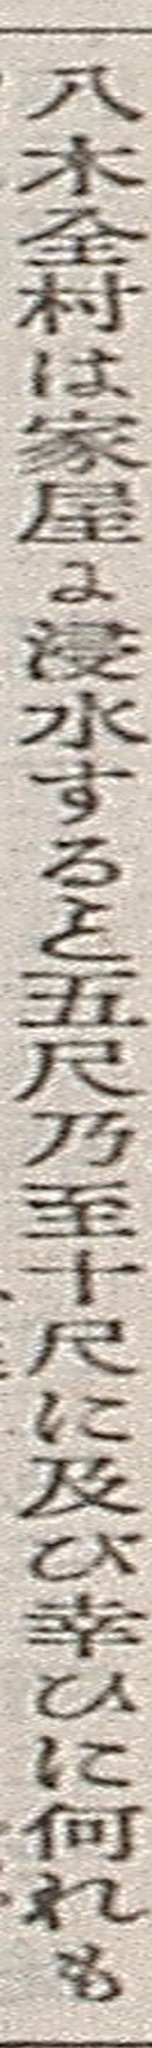八木全村は家屋に浸水すること五尺乃至十尺に及び幸ひに何れも
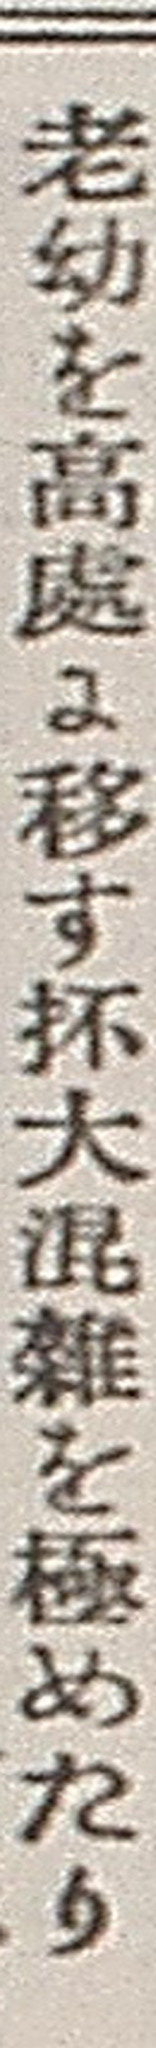老幼を高処に移す抔大混雑を極めたり
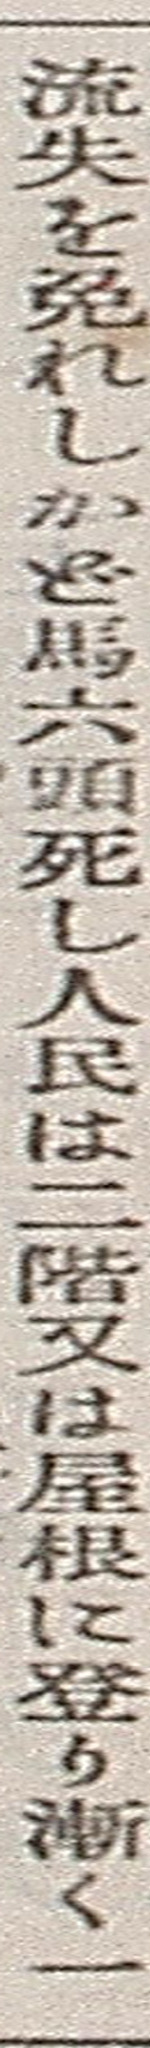流失を免れしかと馬六頭死し人民は二階又は屋根に登り漸く一
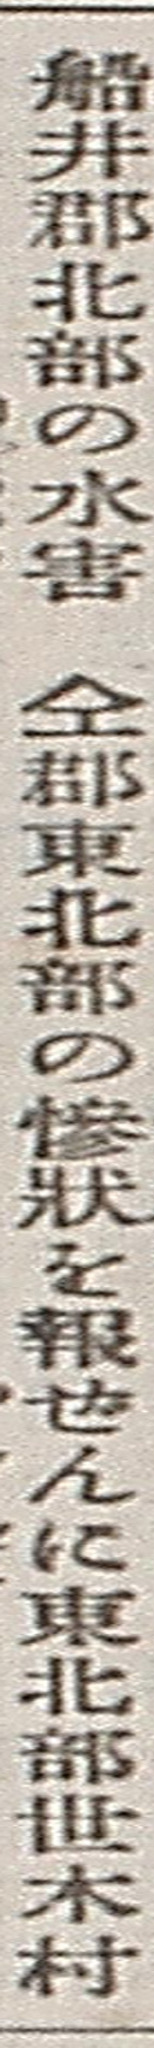船井郡北部の水害同郡東北部の惨状を報ぜんに東北部世木村
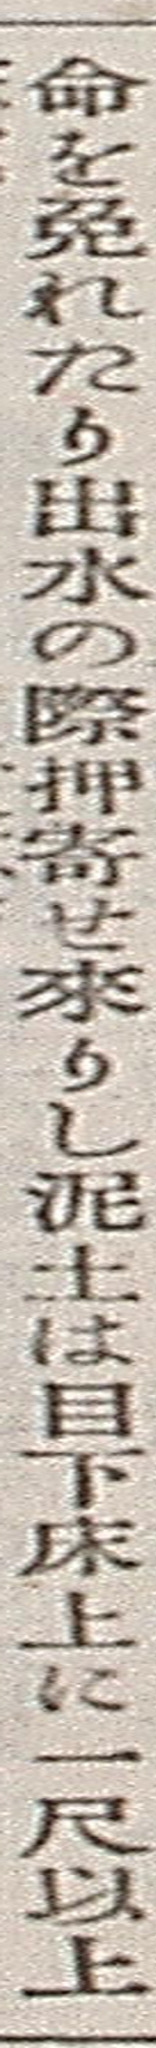命を免れたり出水の際押寄せ来りし泥土は目下床上に一尺以上
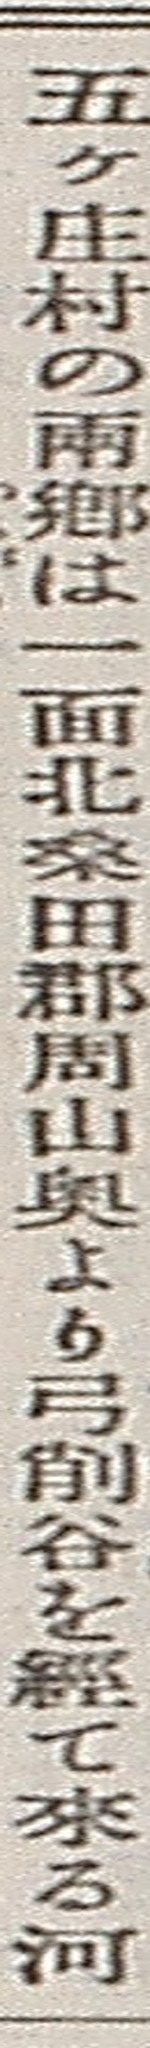五ヶ庄村の両郷は一面北桑田郡周山奥より弓削谷を経て来る河
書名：風俗畫報臨時増刊第百二十六號　洪水被害録（中）
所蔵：東京大学地震研究所図書室 Earthquake Research Institute Library, The University of Tokyo, JAPAN
